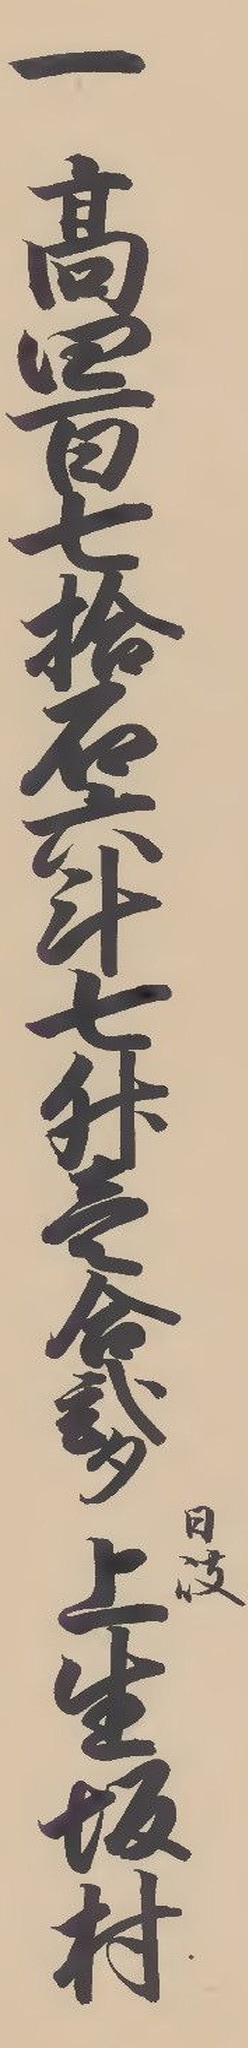一高四百七拾石六斗七升壱合弐勺上生坂村

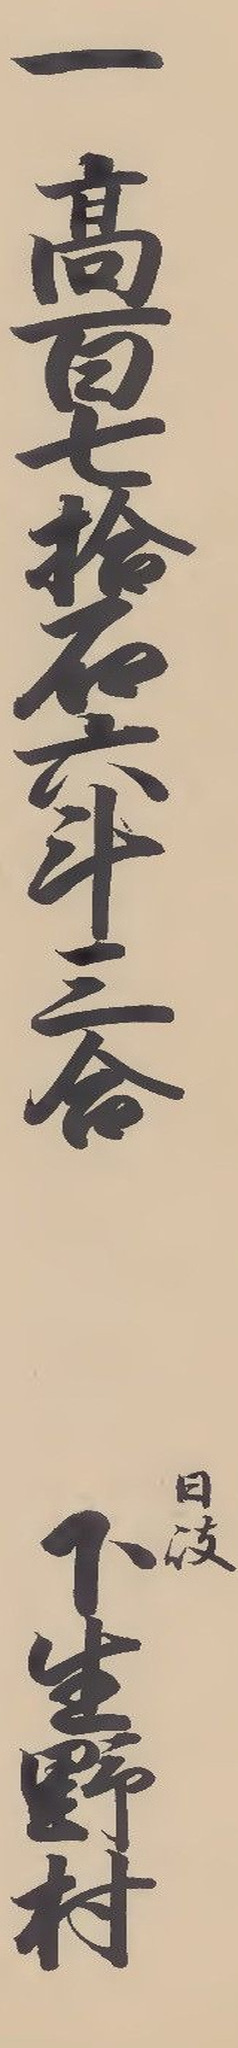一高百七拾石六斗三合下生野村
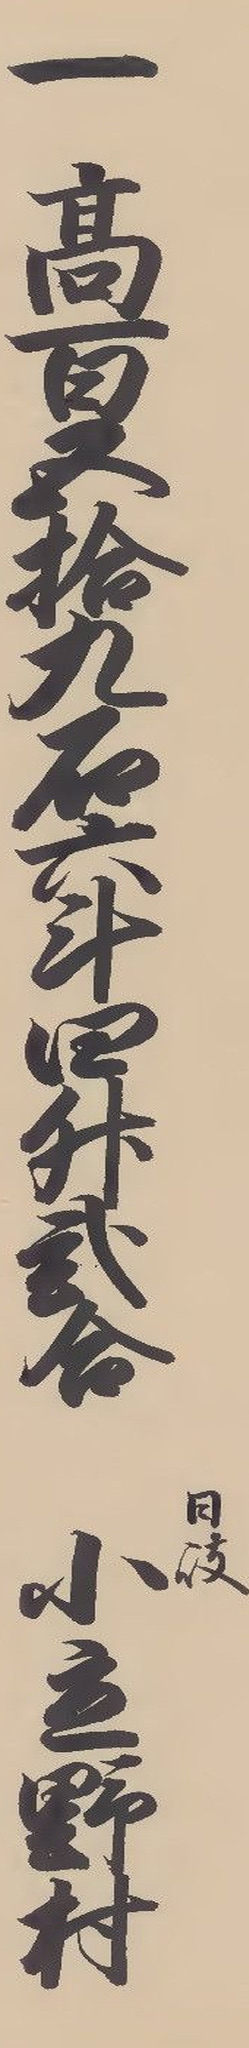一高百五拾九石六斗四升弐合小立野村
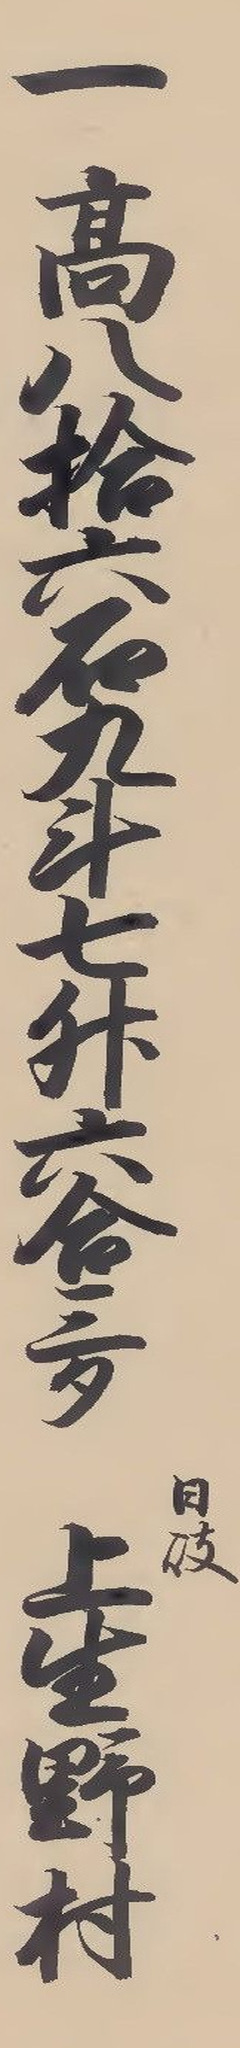一高八拾六石九斗七升六合三勺上生野村
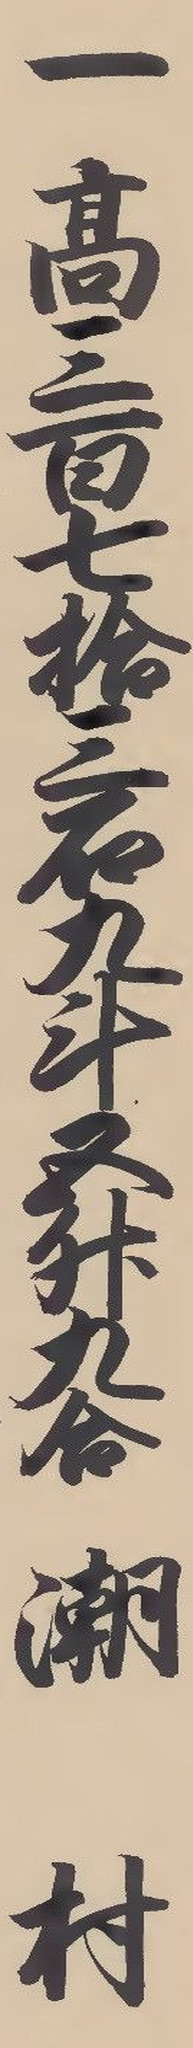一高三百七拾三石九斗五升九合潮村
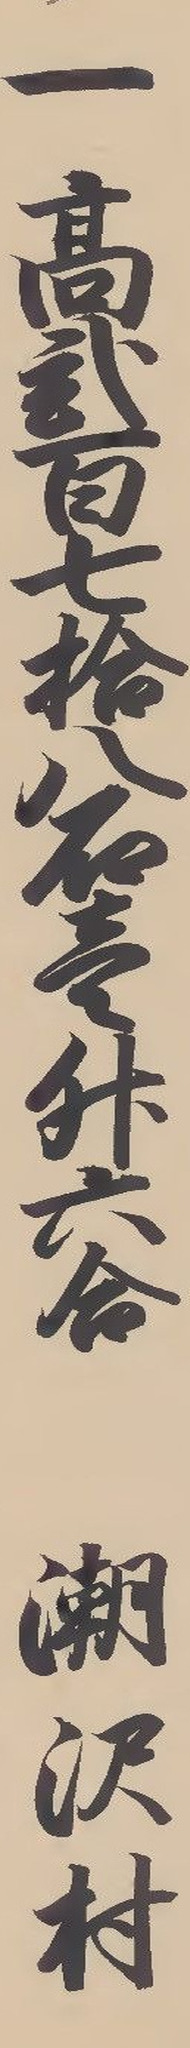一高弐百七拾八石壱升六合潮沢村
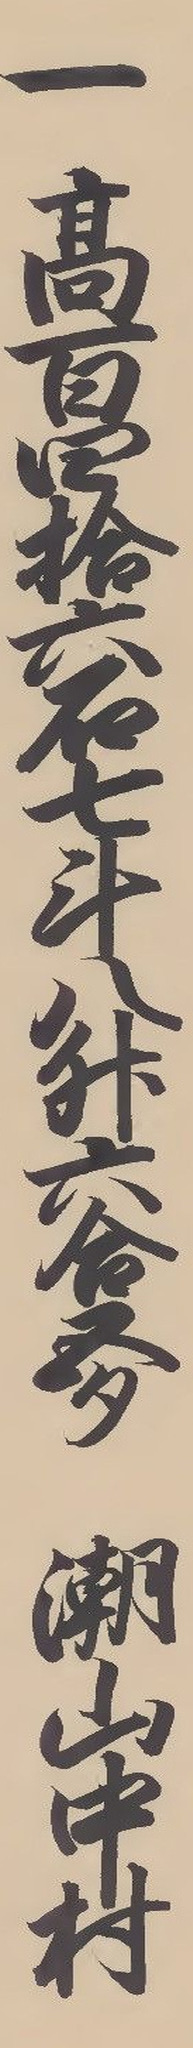一高百四拾六石七斗八升六合五勺潮山中村
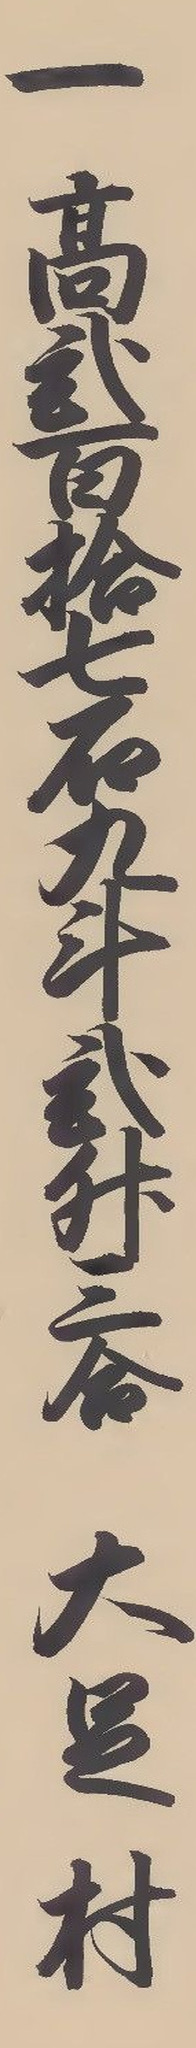一高弐百拾七石九斗弐升三合大足村
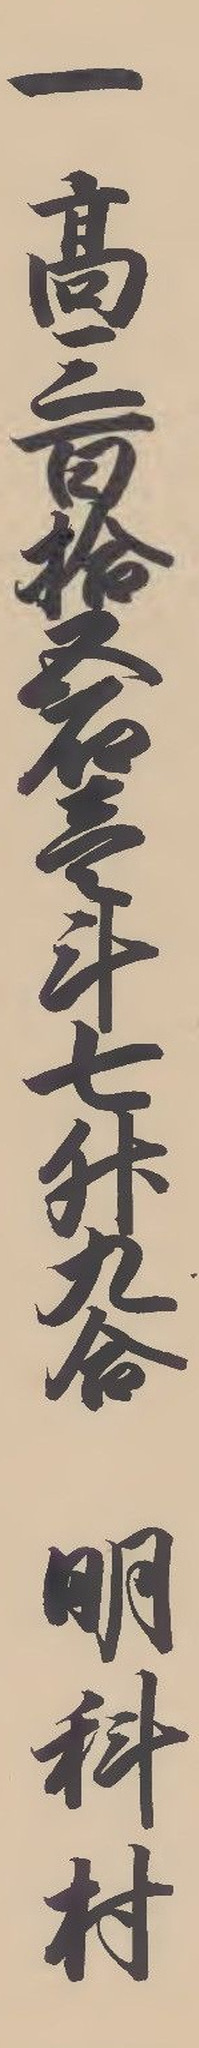一高三百拾五石壱斗七升九合明科村

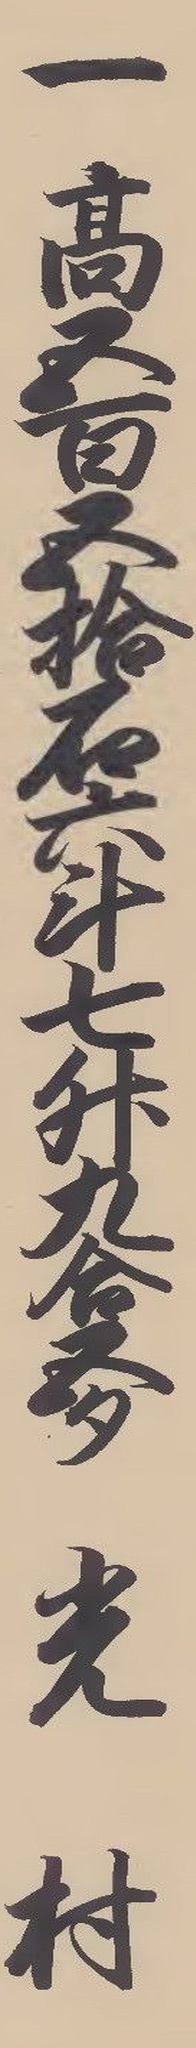一高五百五拾石六斗七升九合五勺光村
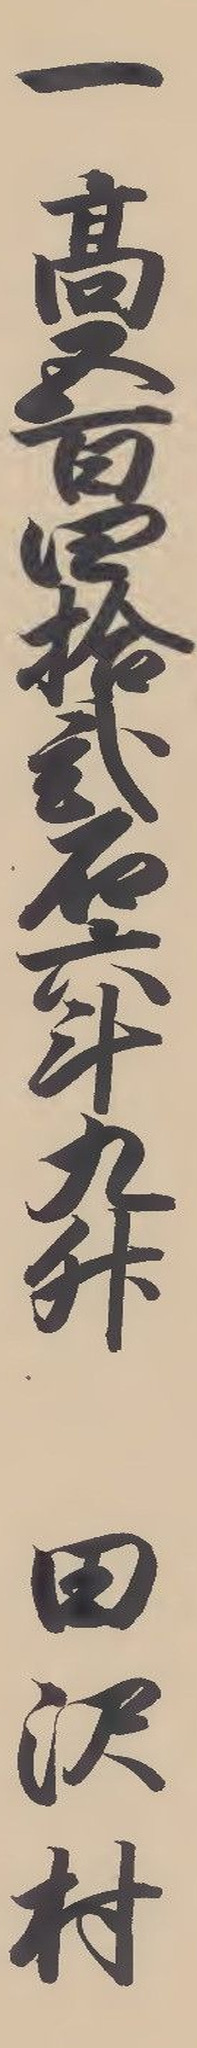一高五百四拾弐石六斗九升田沢村
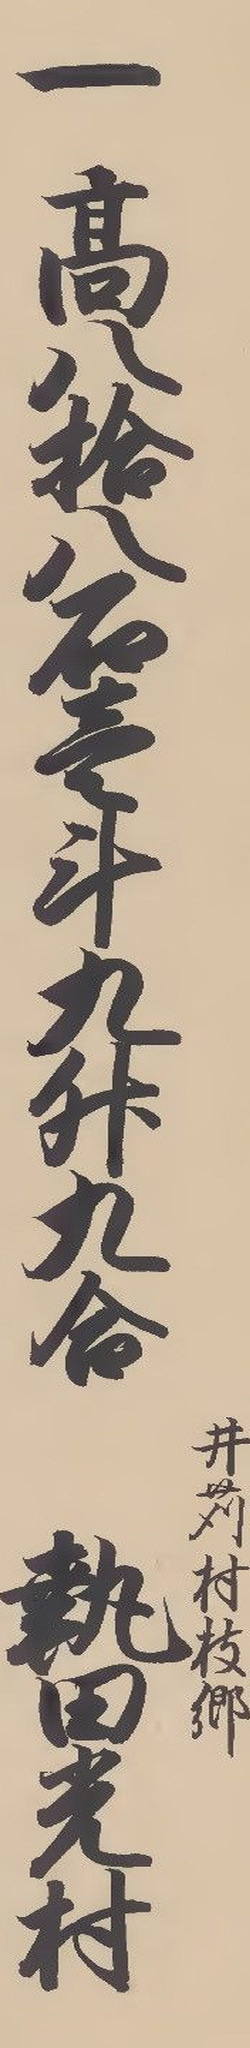一高八拾八石壱斗九升九合執田光村

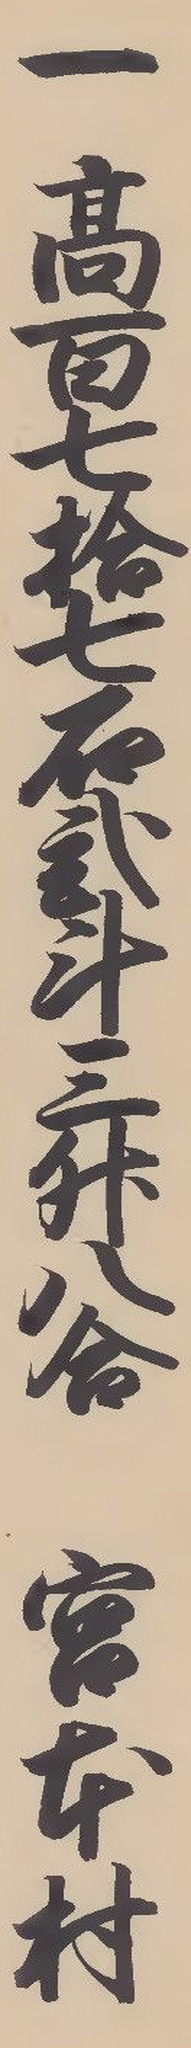一高百七拾七石弐斗三升八合宮本村
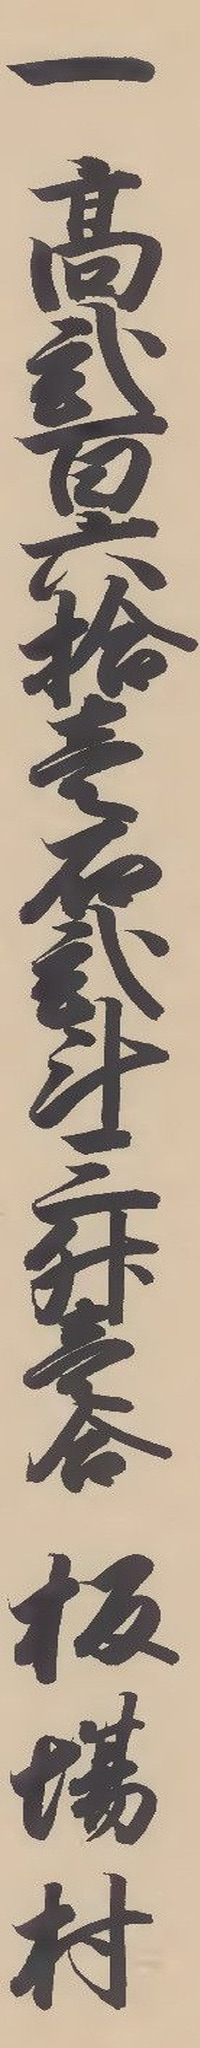一高弐百六拾壱石弐斗三升壱合板場村
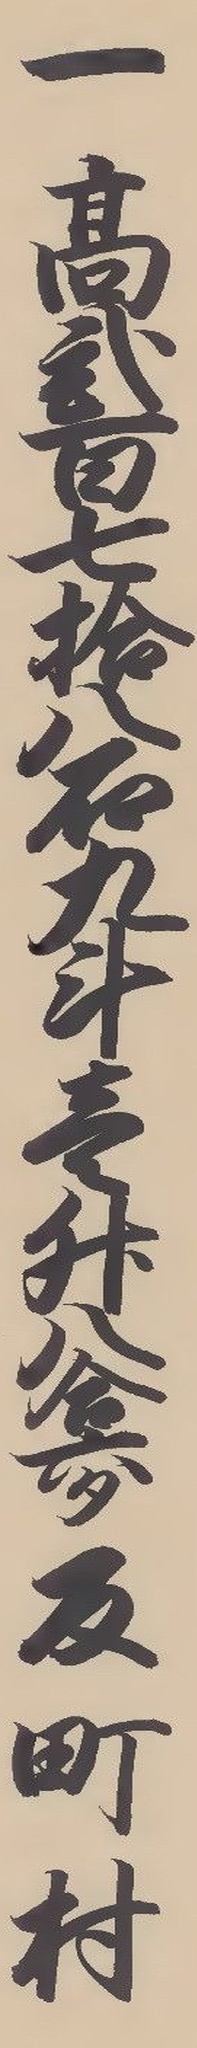一高弐百七拾八石九斗壱升八合六勺反町村
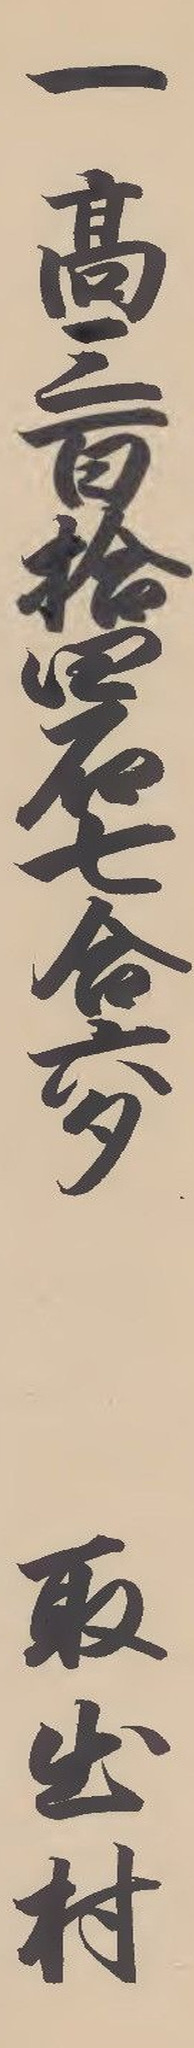一高三百拾四石七合六勺取出村
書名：信濃国郷帳
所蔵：国立公文書館 National Archives of Japan
